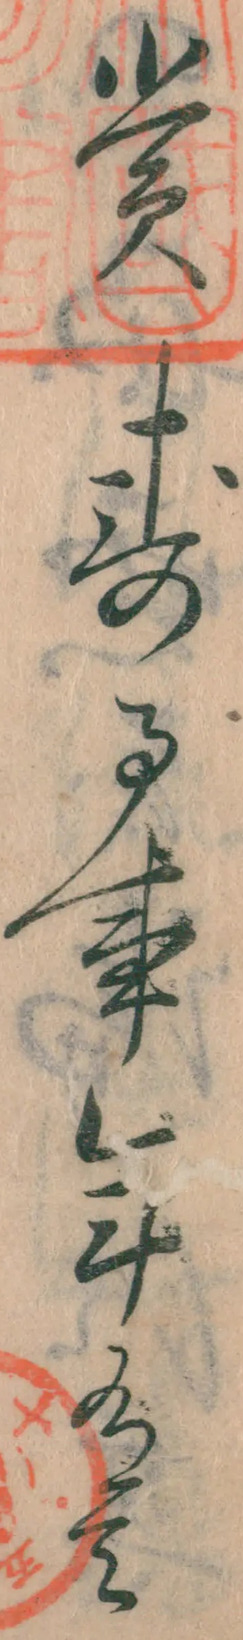賞する事年有て
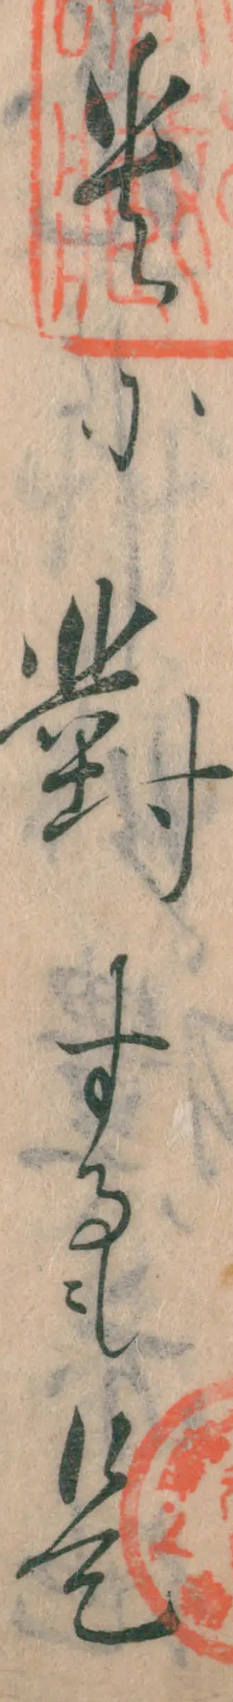貴に対するも是
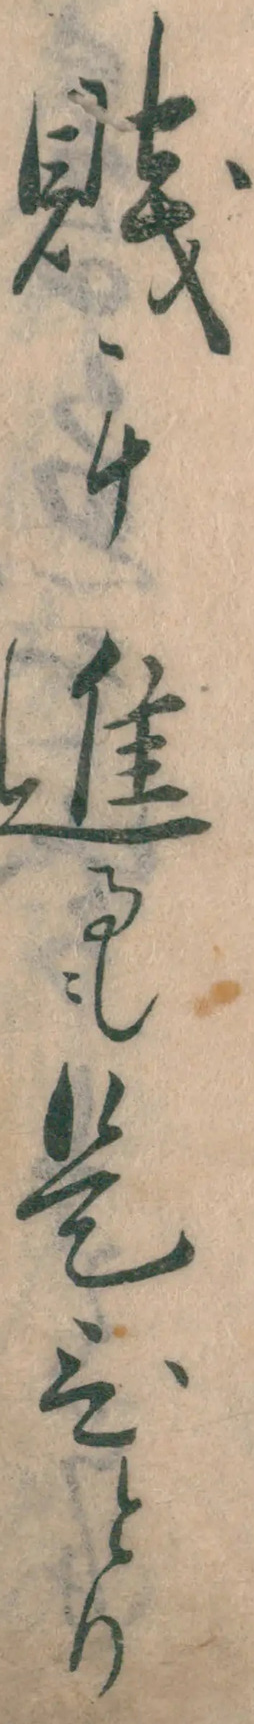賎に進るも是ひとり

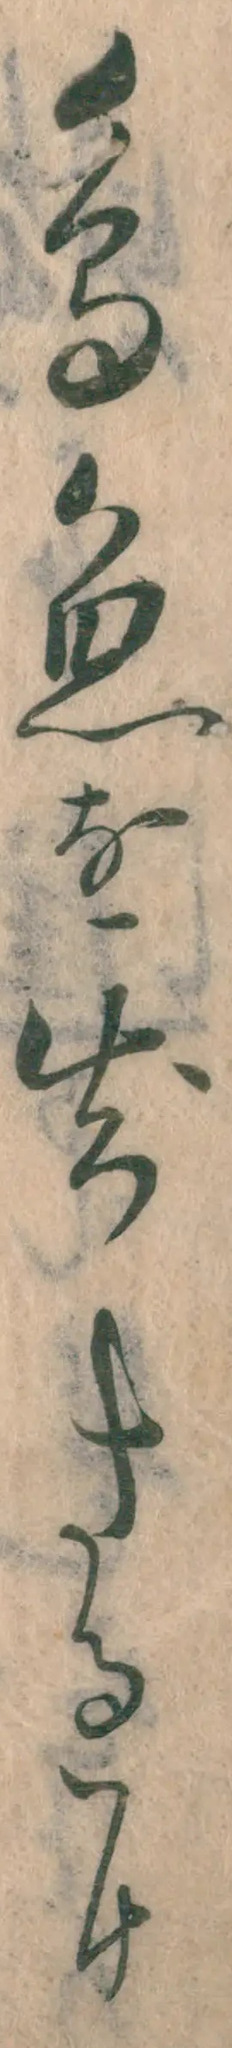鳥魚を知さるに
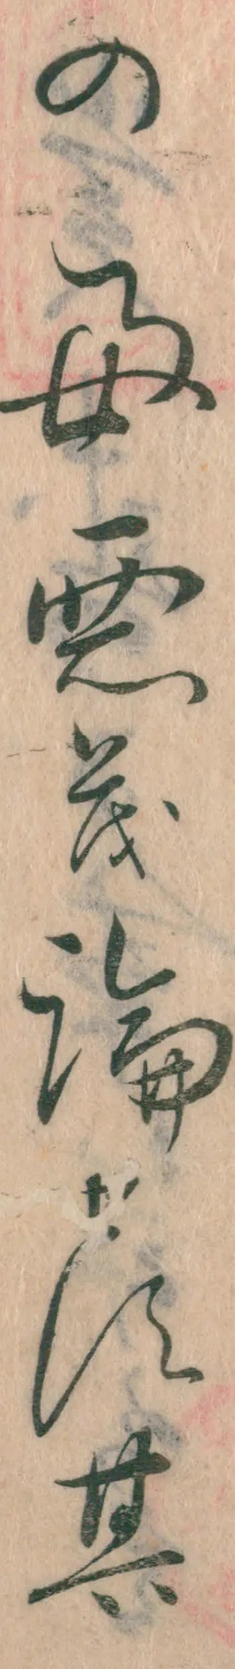の好悪も論せす其
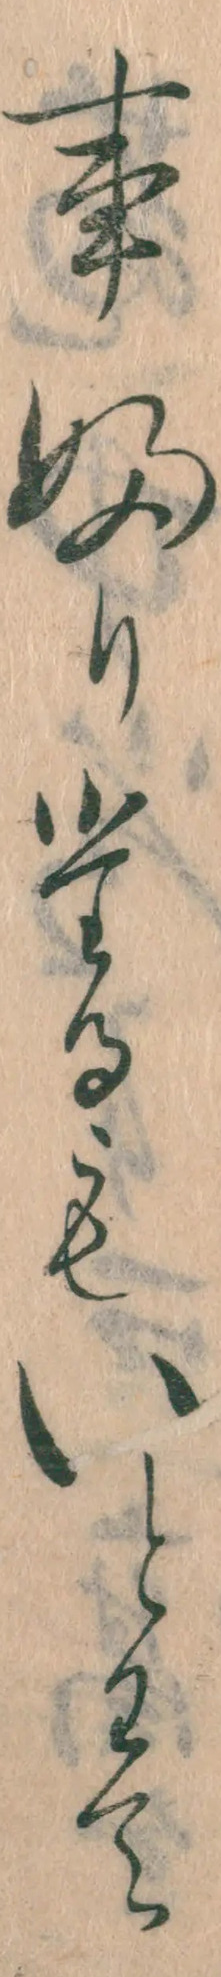事ふりたるもいとわて
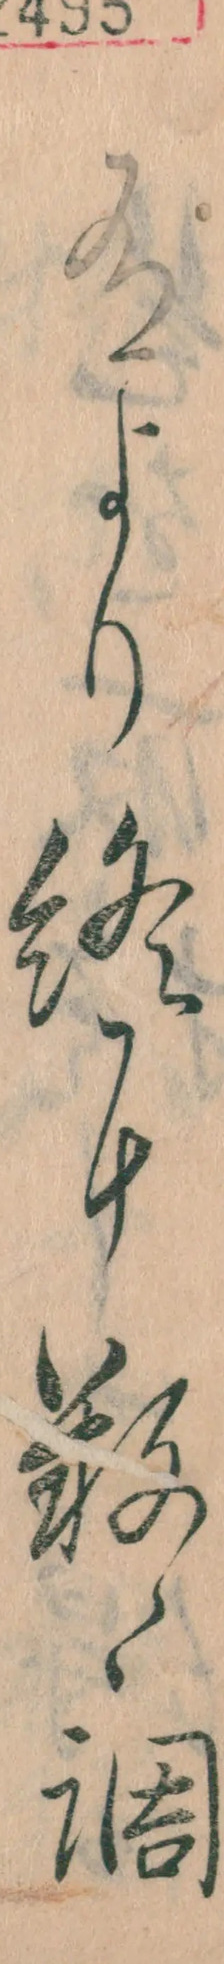有より終に数々調
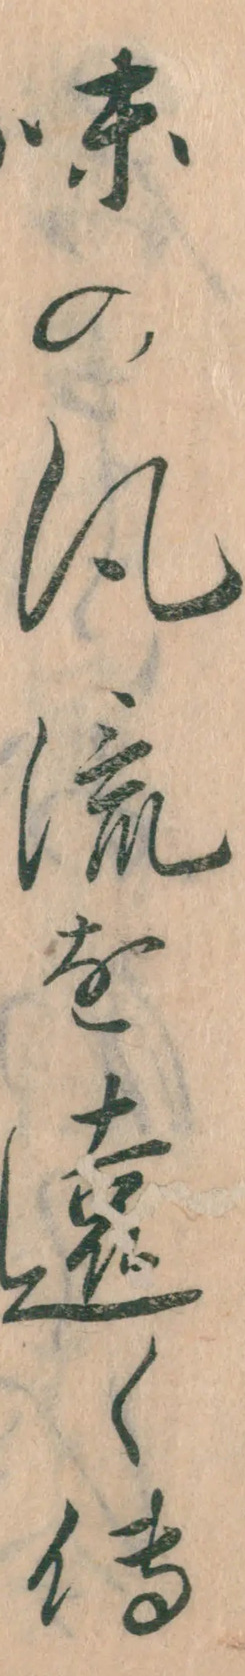味の風流を遠く伝
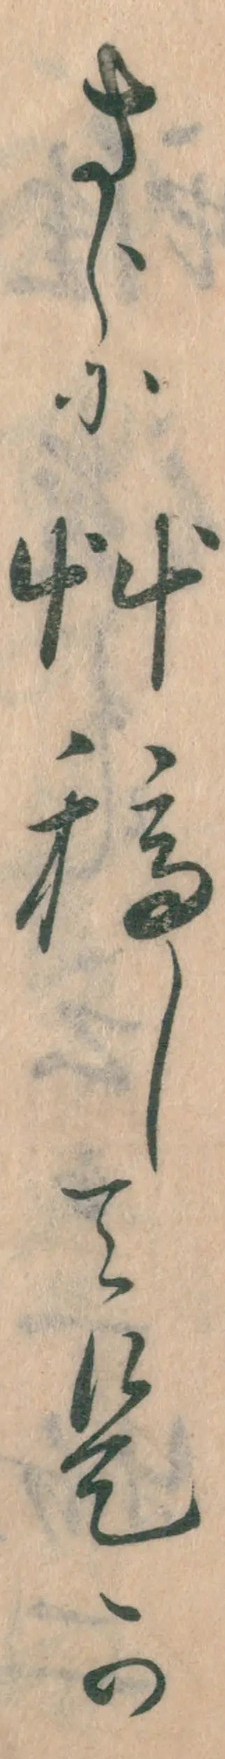さらに草稿して是か
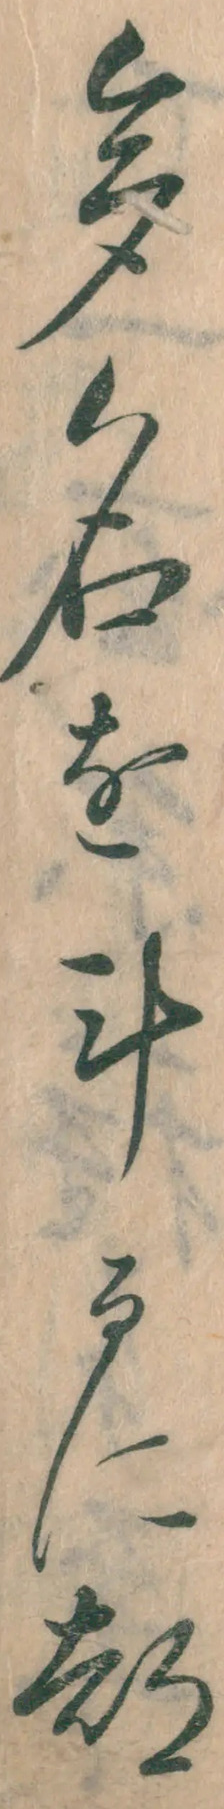多名を計るに都

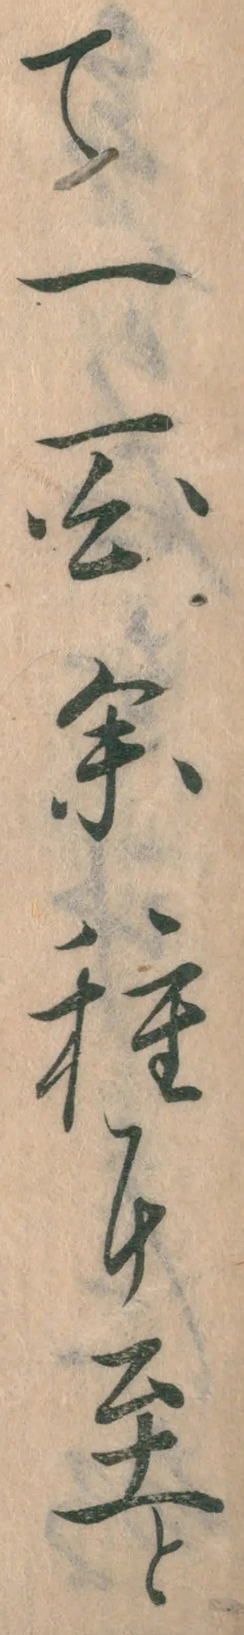て一百余種に至と
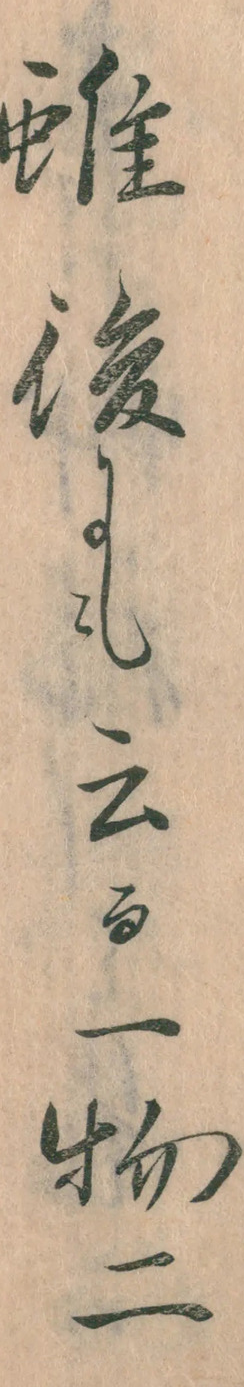雖後にも云る一物二
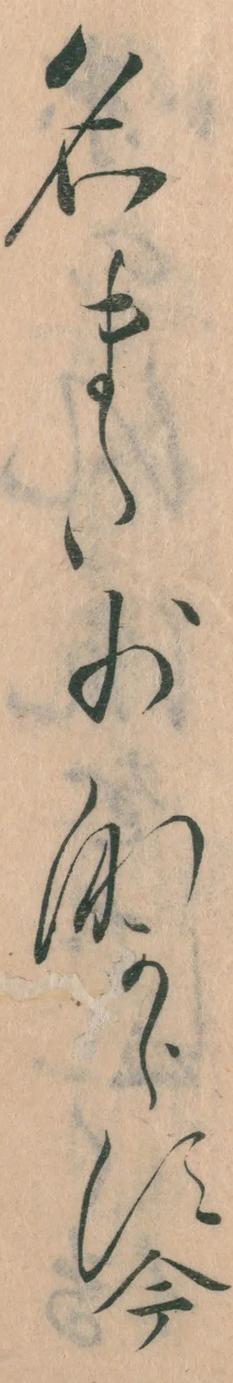名また少なからす今
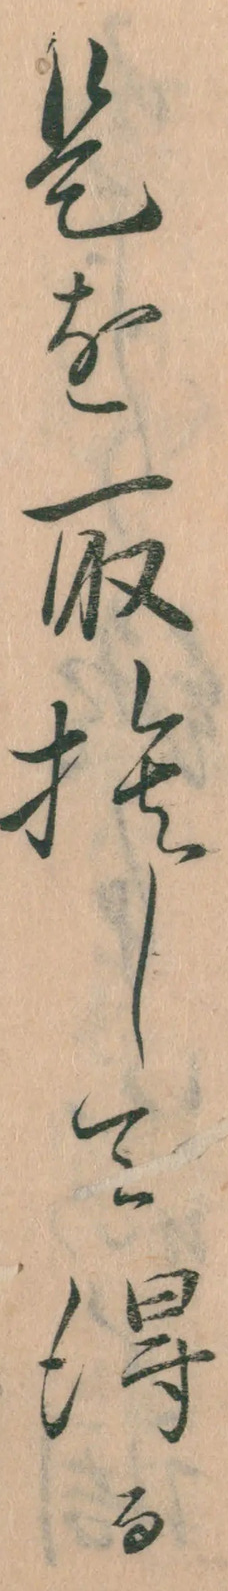是を取捨して得る
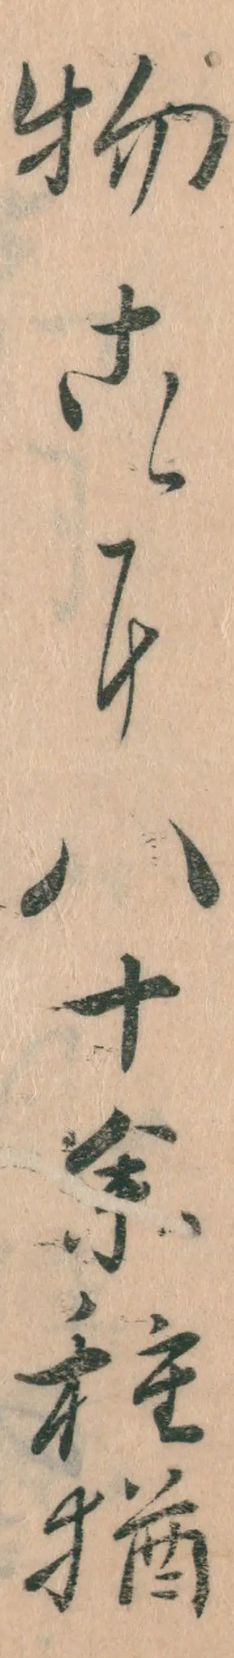物こゝに八十余種猶
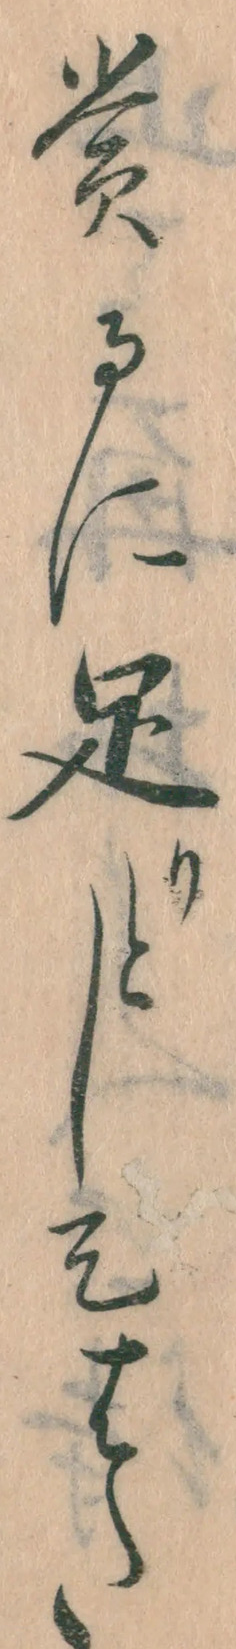賞るに足りとしてはた
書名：豆腐百珍余録
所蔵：国立国会図書館 National Diet Library, JAPAN
